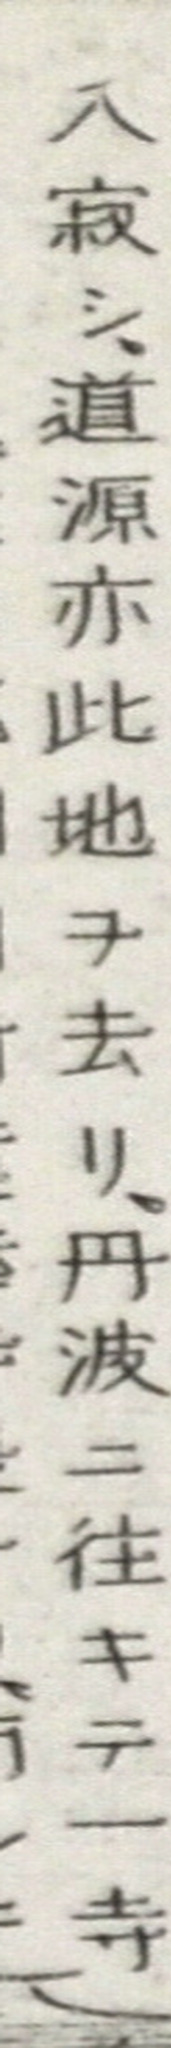入寂シ、道源亦此地ヲ去リ、丹波ニ往キテ一寺
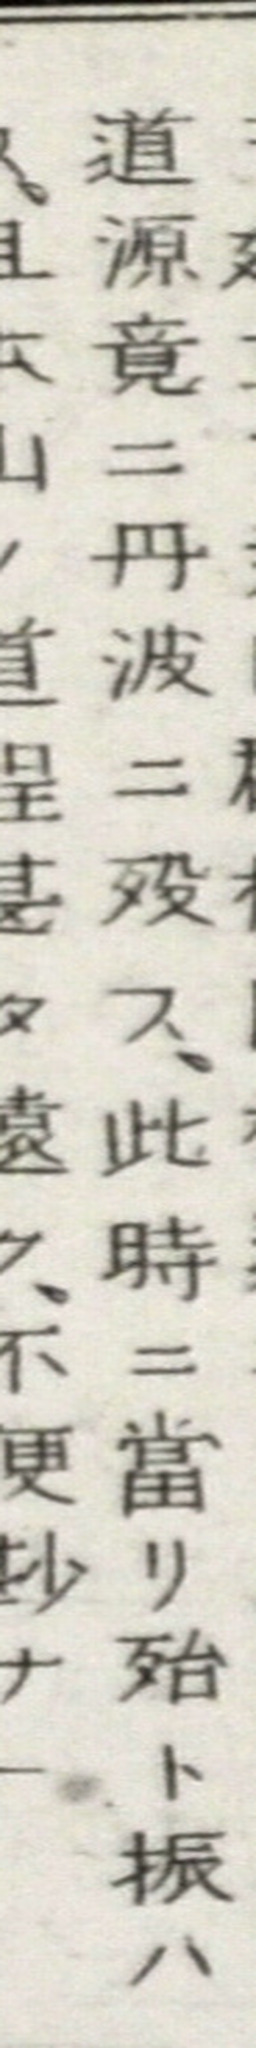ス、且本山ノ道程甚タ遠ク、不便尠ナ
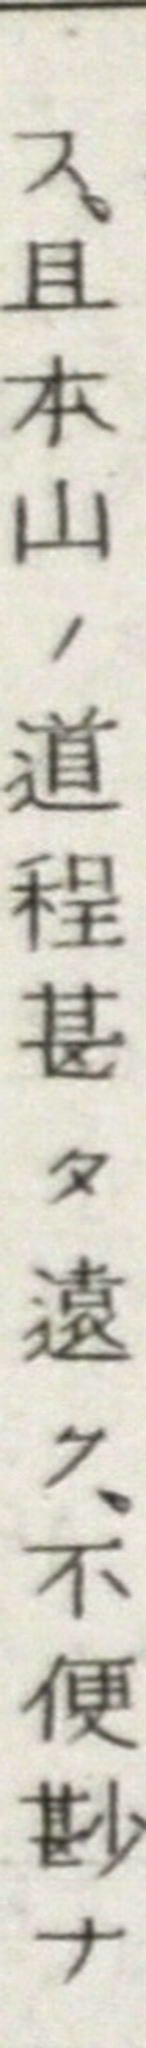ス、且本山ノ道程甚タ遠ク、不便尠ナ
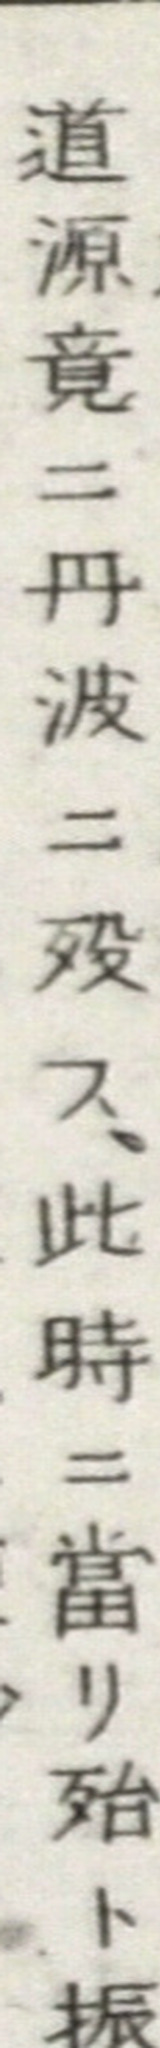道源竟ニ丹波ニ没ス、此時ニ当リ殆ト振ハ
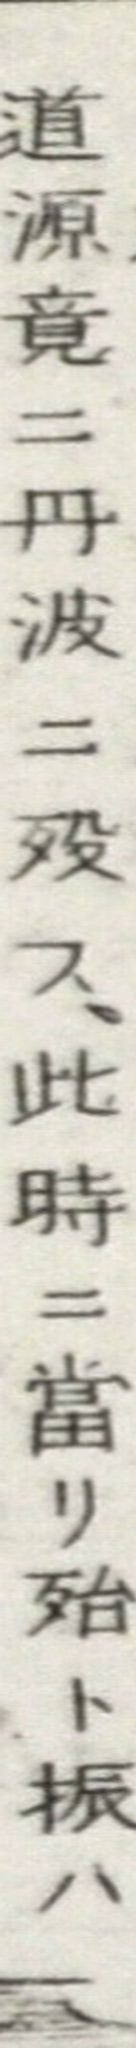道源竟ニ丹波ニ没ス、此時ニ当リ殆ト振ハ
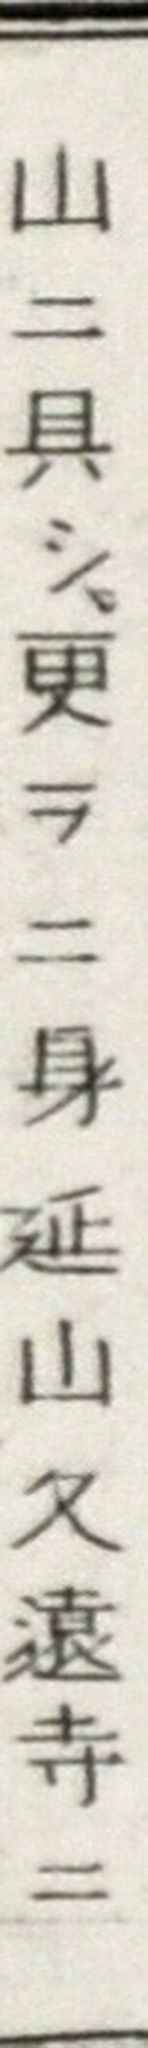山ニ具シ、更ラニ身延山久遠寺ニ
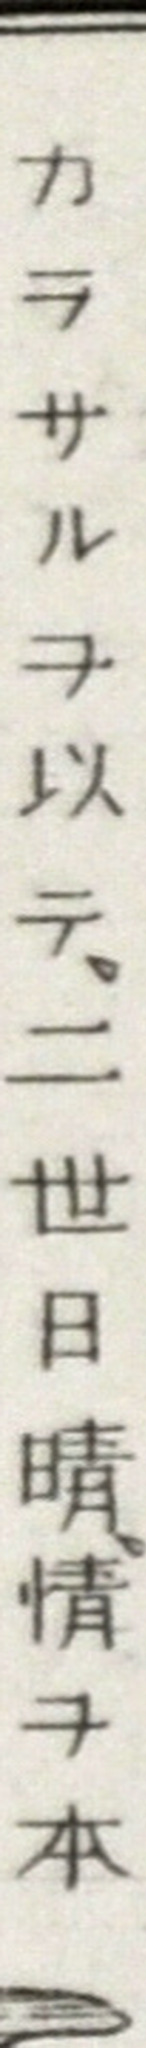カラサルヲ以テ、二世日晴、情ヲ本
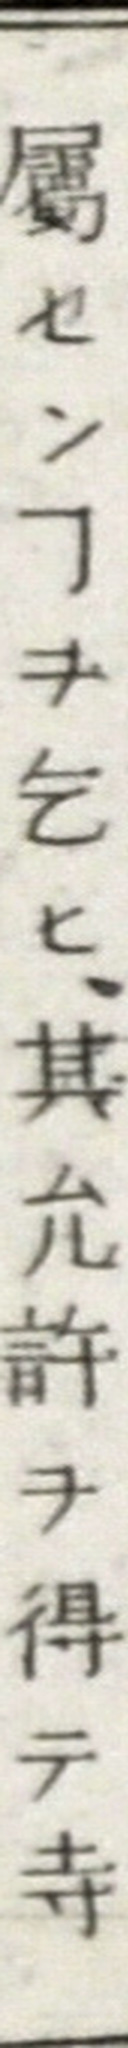属センコトヲ乞ヒ、其允許ヲ得テ寺
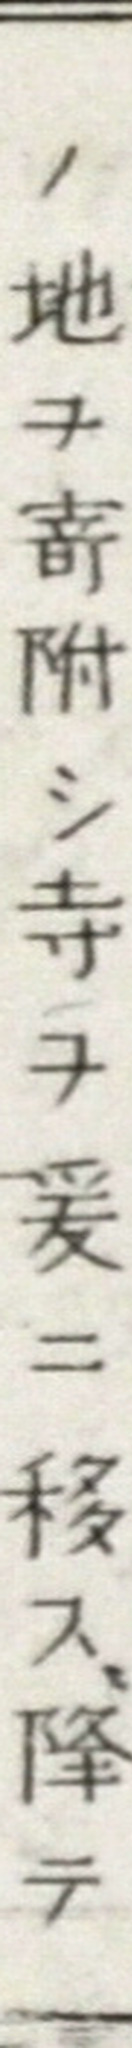ノ地ヲ寄附シ寺ヲ爰ニ移ス、降テ
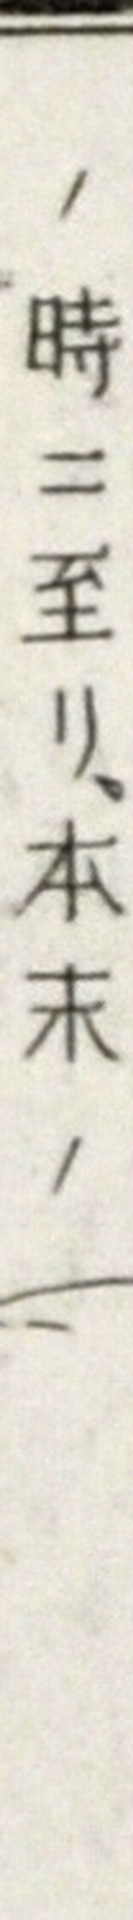ノ時ニ至リ、本末ノ
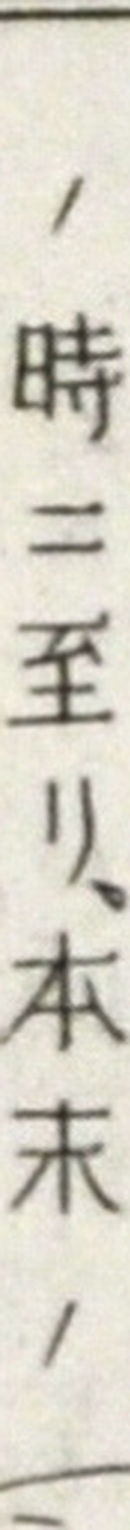ノ時ニ至リ、本末ノ
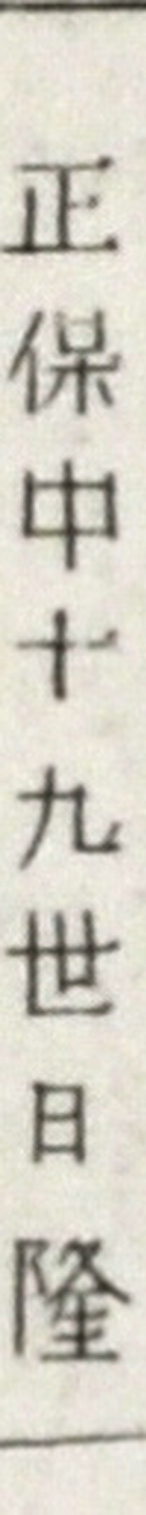正保中十九世日隆
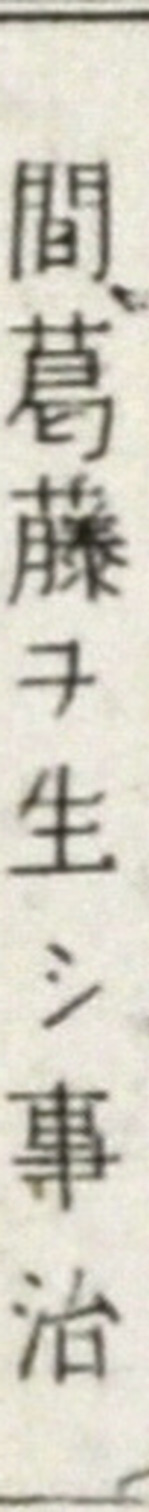間、葛藤ヲ生シ事治
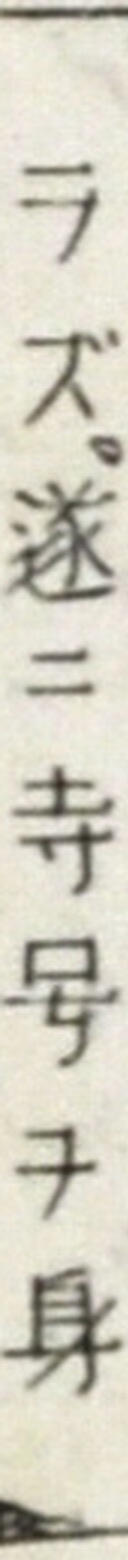ラズ、遂ニ寺号ヲ身
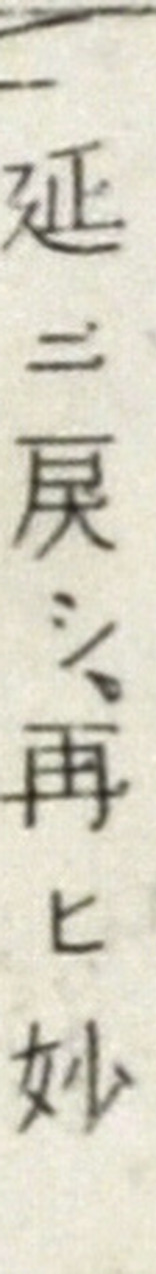延ニ戻シ、再ヒ妙
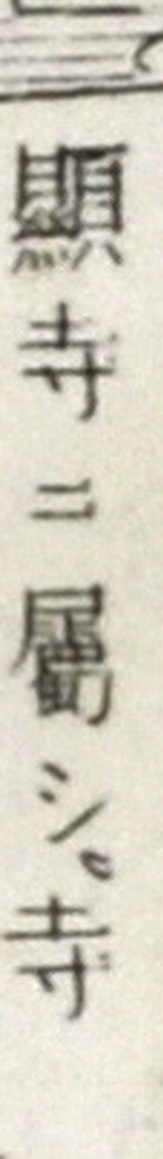顕寺ニ属シ、寺
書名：桂泉院・樹林寺・東光寺縁起書、蓮華寺由来書、付夕顔観音記
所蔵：伊那市立高遠町図書館・合同会社AMANE
